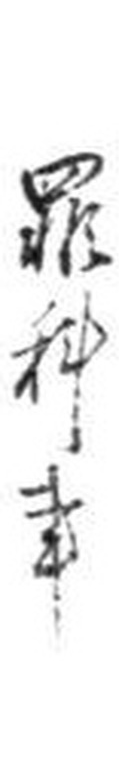罪科事
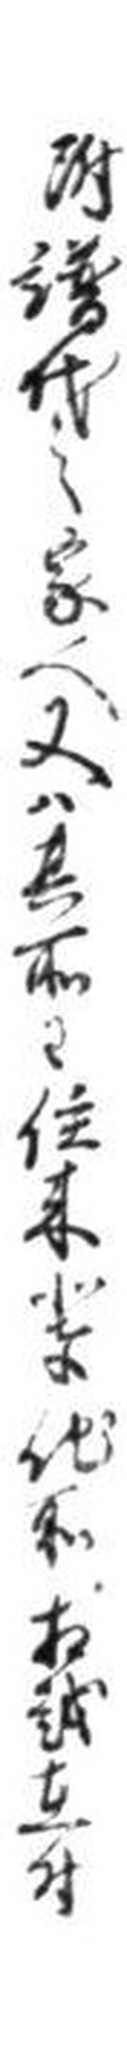附譜代之家人又ハ其所に住来輩他所相越在付
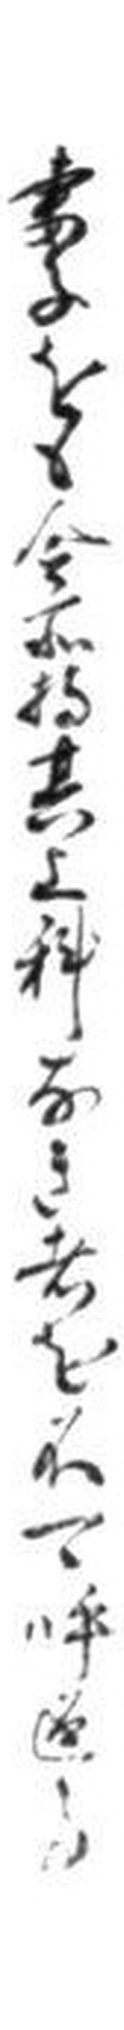妻子をも令所持其上科なき者を不可呼返事
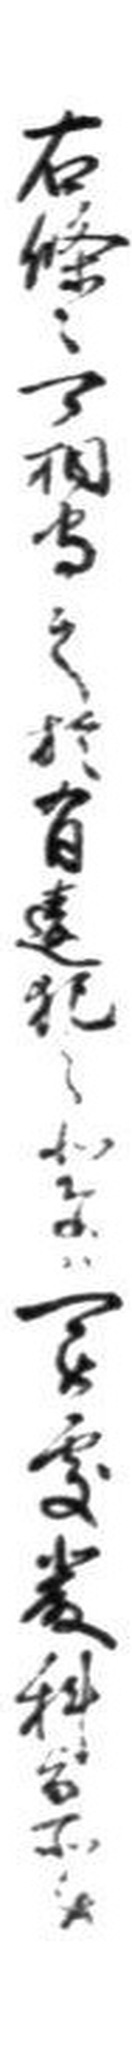右条々可相守之於有違犯之輩ハ可被処厳科旨所被
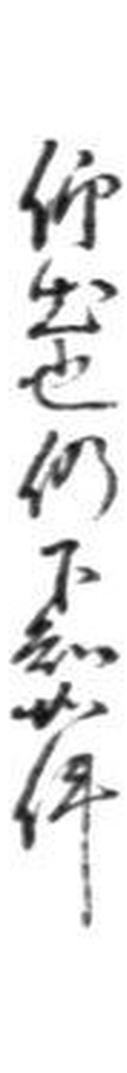仰出也仍下知如件
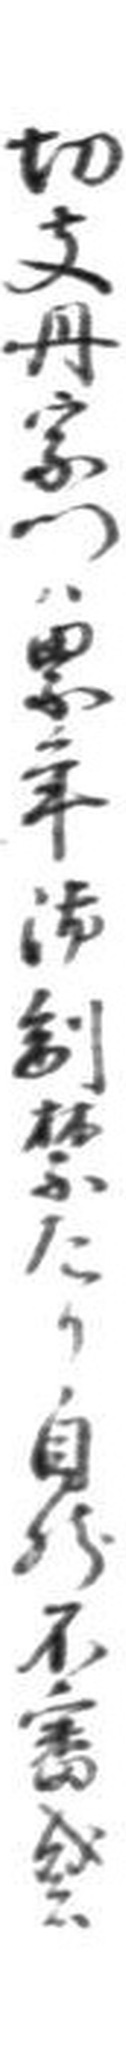切支丹宗門ハ累年御制禁たり自然不審成者
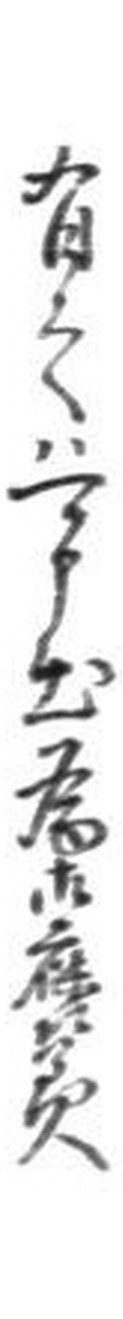有之ハ可申出為御褒美

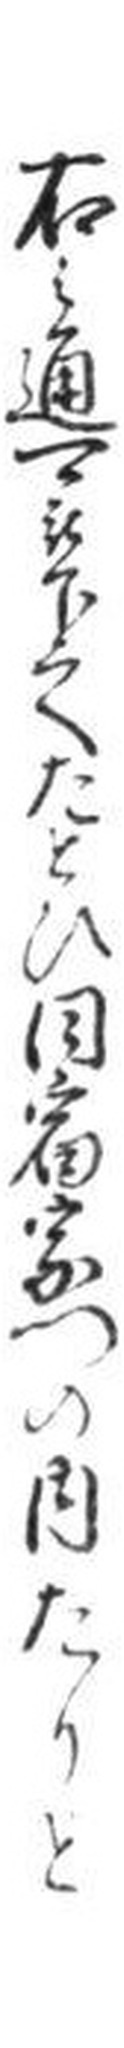右之通可被下之たとひ同宿宗門の内たりと
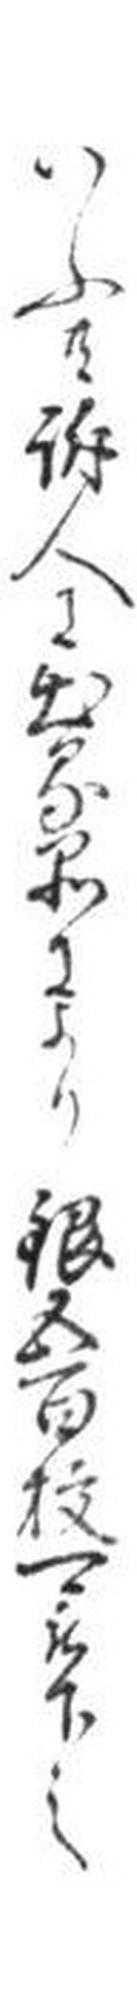いふ共訴人に出る品により銀五百枚可被下之
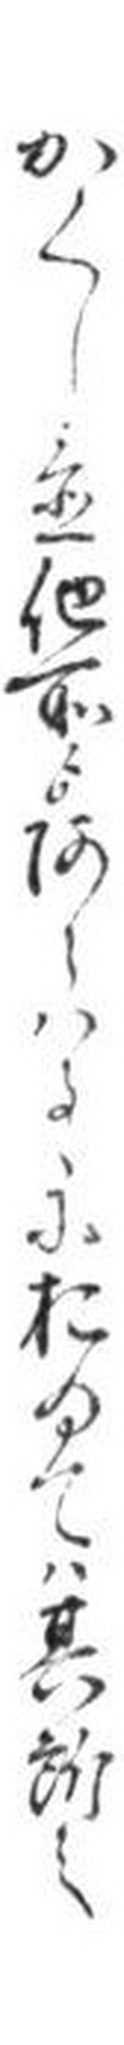かくし置他所ゟあらハるゝにおゐてハ其所之
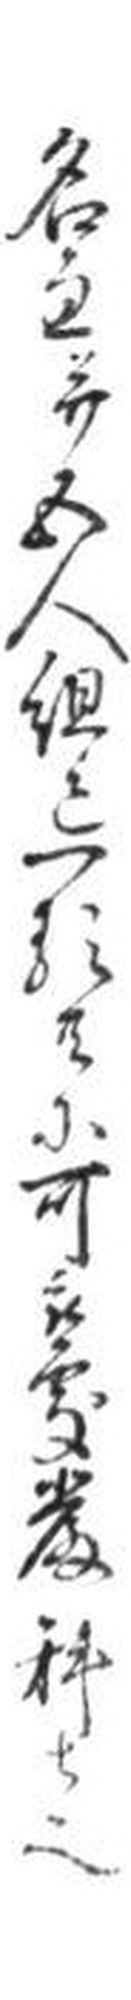名主并五人組迄一類共に可被処厳科者也
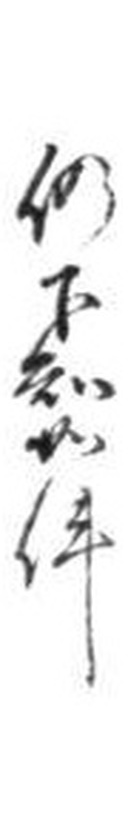仍下知如件
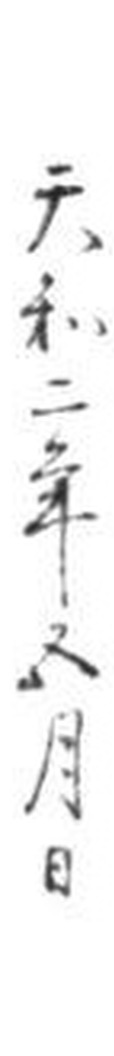天和二年五月日
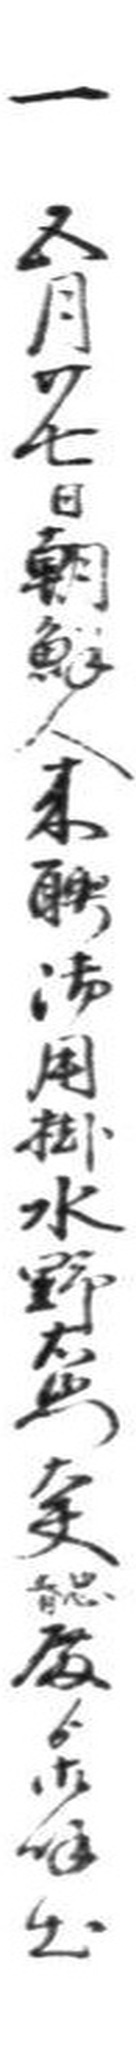一五月廿七日朝鮮人来聘御用掛水野右衛門大夫忠春殿ゟ御呼出
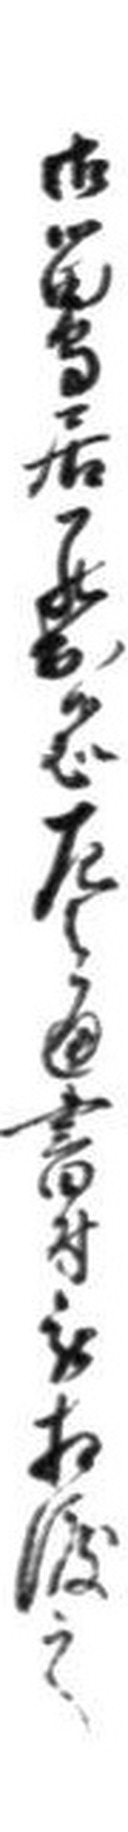御留守居罷出候処左之通書付被相渡之
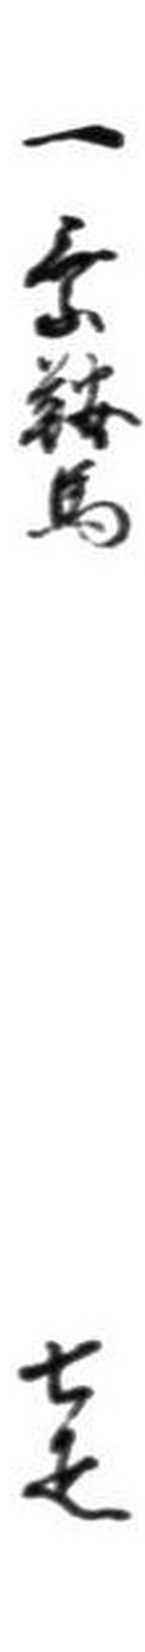一乗鞍馬七疋
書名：家譜 十五 綱昌公 従天和元年到元禄十二年
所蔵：福井県文書館 Fukui Prefectural Archives
